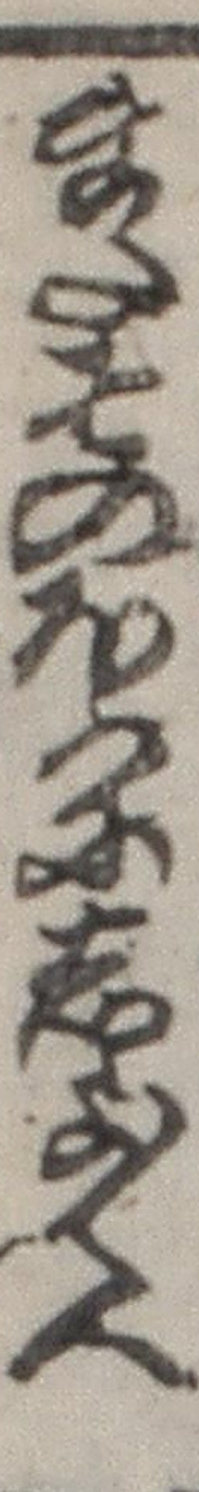またそのほかにしよ〳〵へ
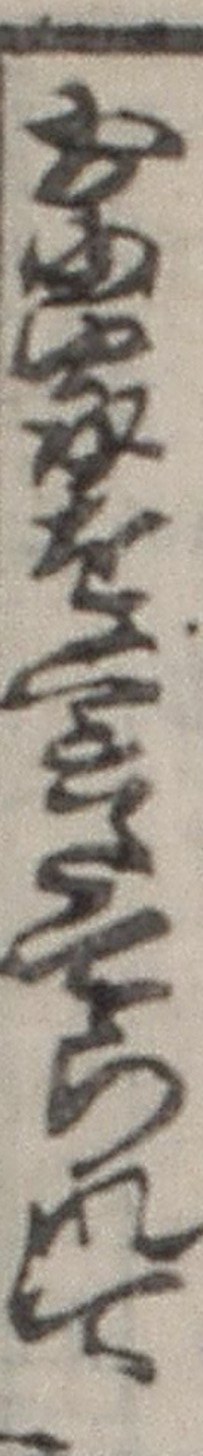お小家をくれたてられて
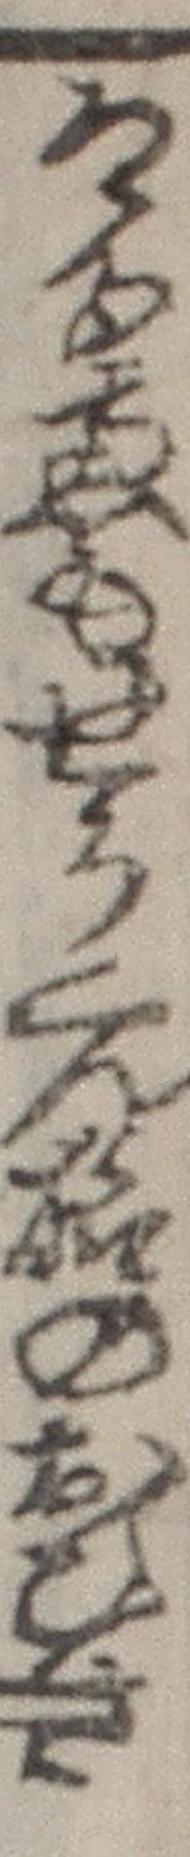かゝる恵もせうくん様のおひさ
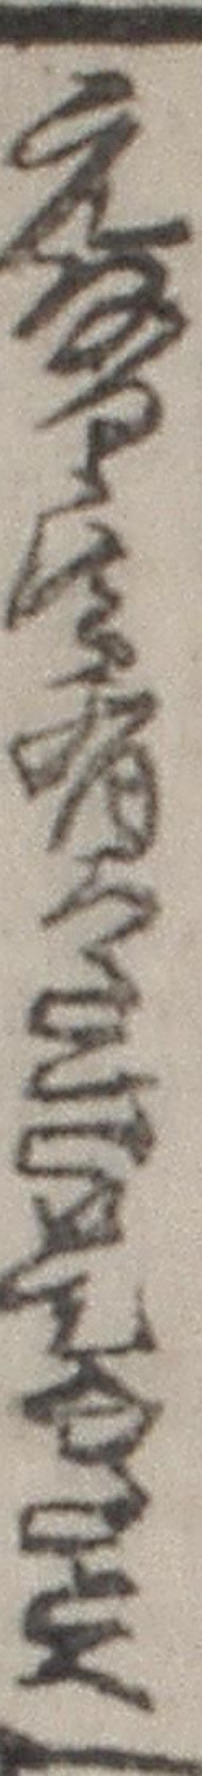元なる其有かたさ是もたとへ
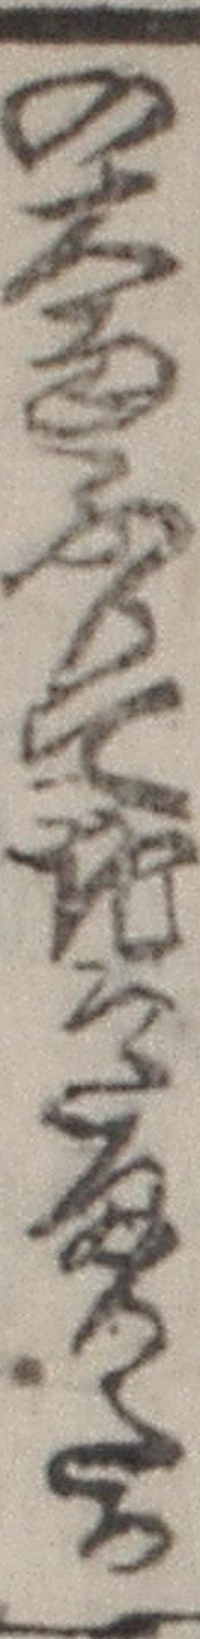の大雨ふりて地かたまりたる
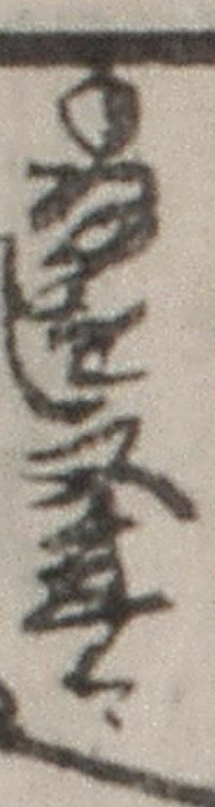〇なをし又年々
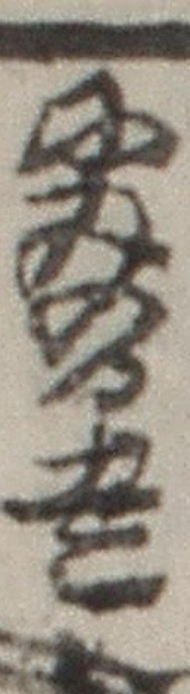にみのる五こ
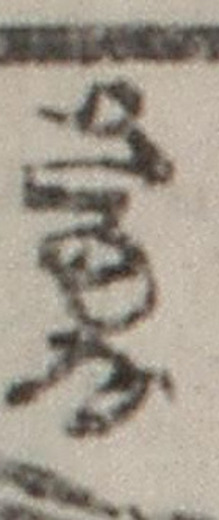さもな
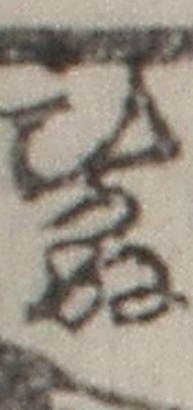ひかぬ

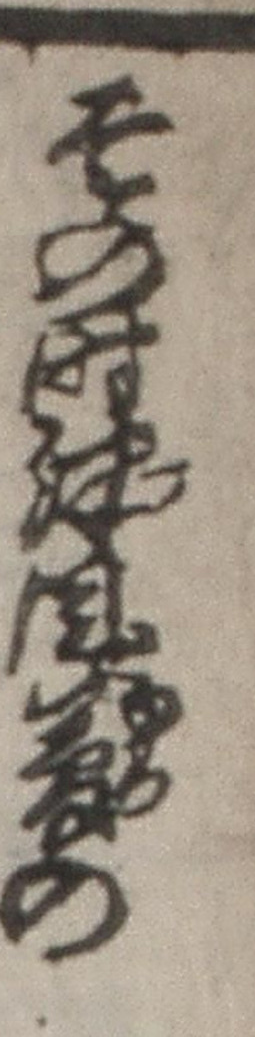その時津風夢の
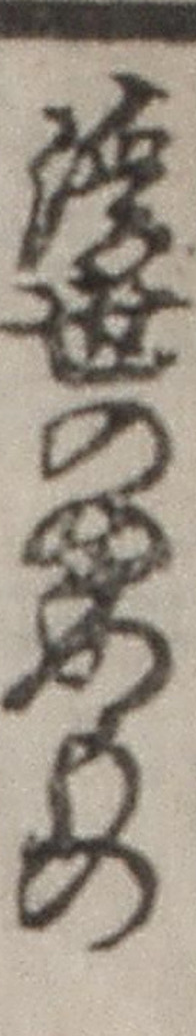浮世のゆめもの
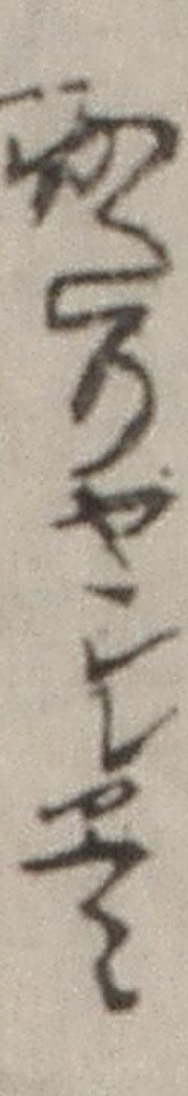かたりヤンレヱ〻
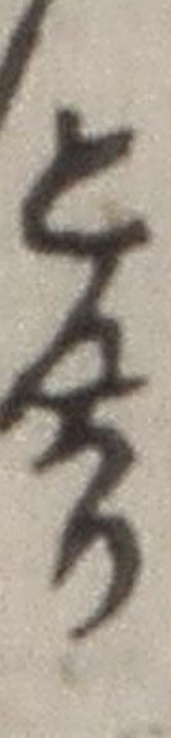こんかり
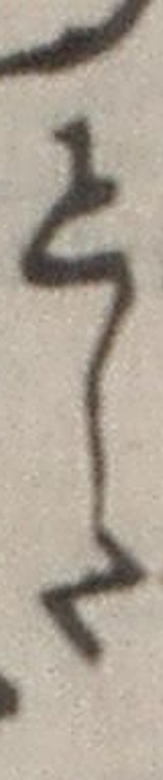とした
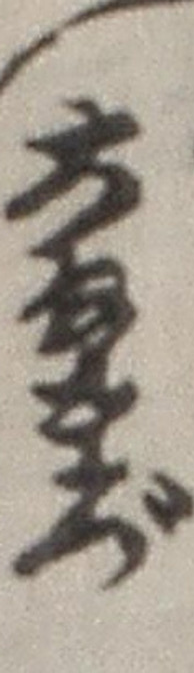大なまづ
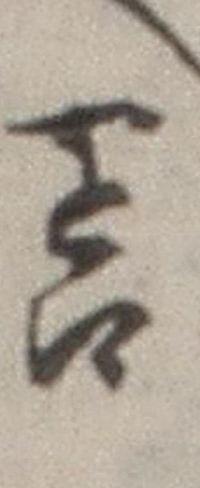一と口
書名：安政二卯年　江戸大地震并出火附
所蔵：東京大学地震研究所図書室 Earthquake Research Institute Library, The University of Tokyo, JAPAN
